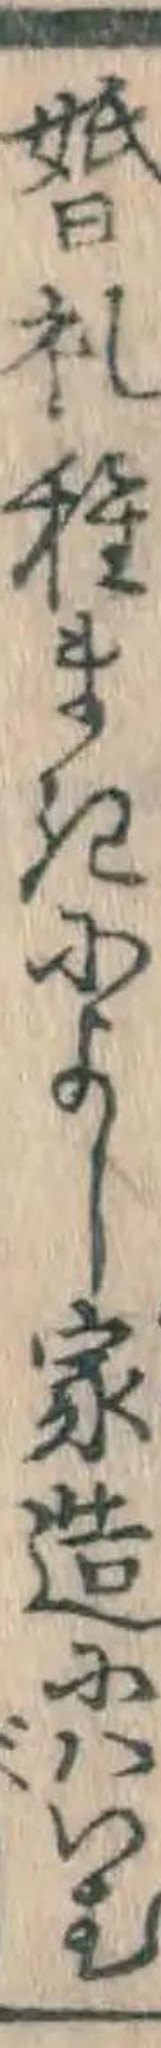婚礼種まきによし家造にはいむべし
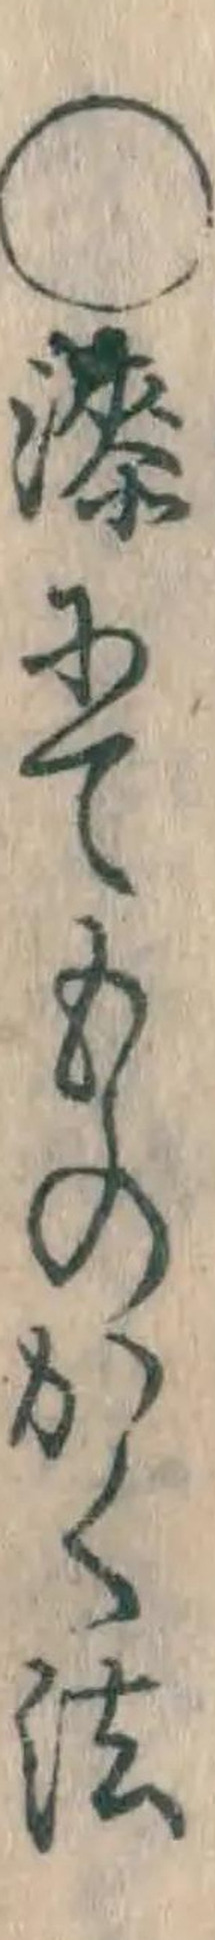○漆にてものかく法

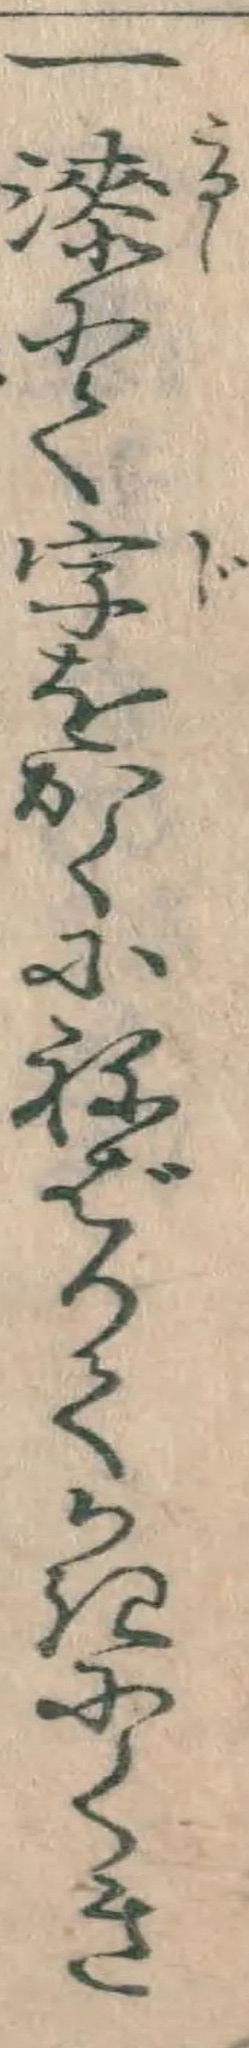一漆にて字をかくにねばりてかきにくき
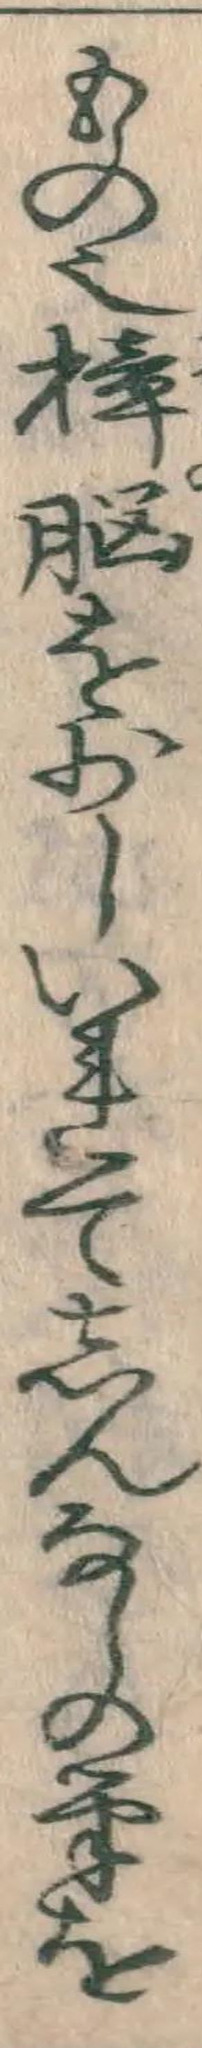もの也樟脳を少しいれてしんなしの筆を
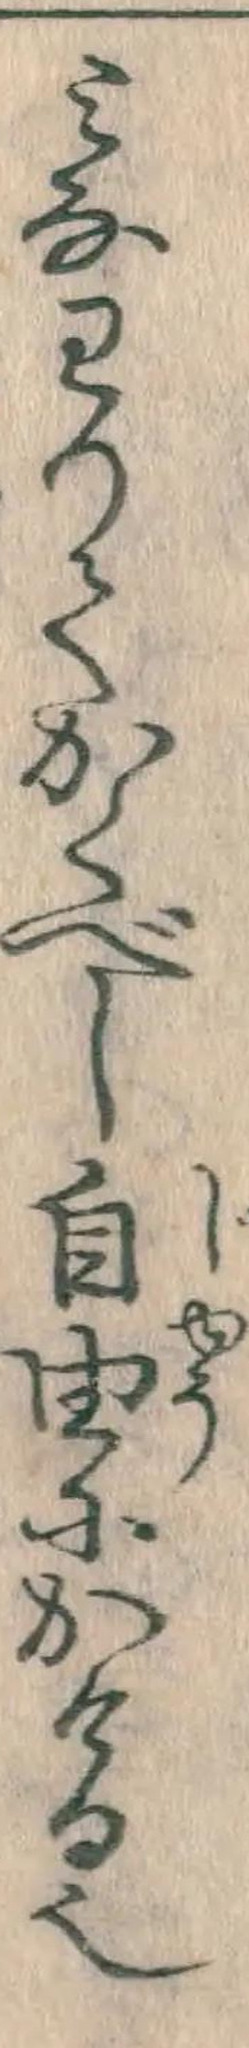みなわりてかくべし自由にかける也
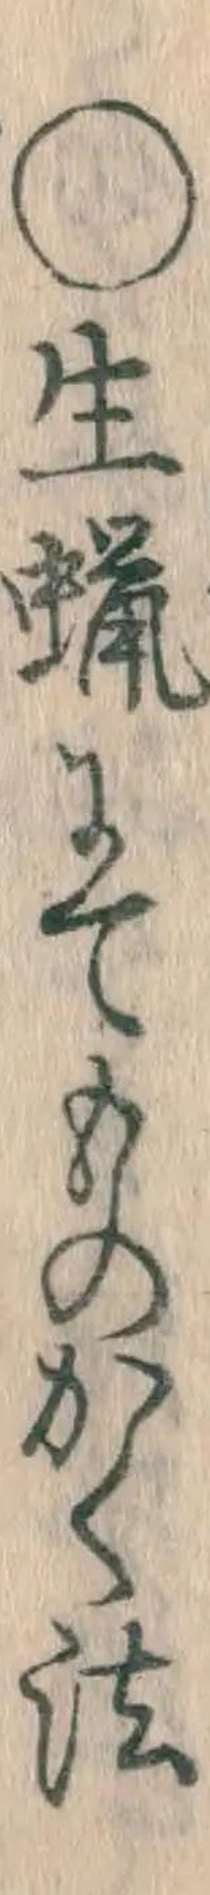○生蠟にてものかく法
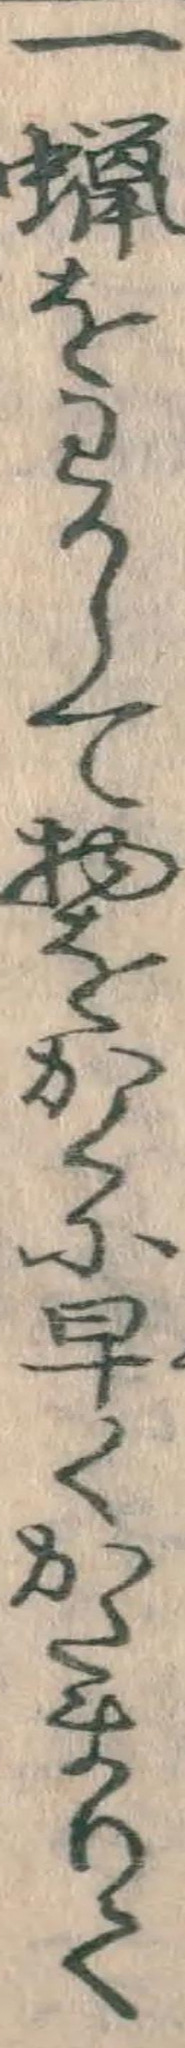一蠟をわかして物をかくに早くかたまりて
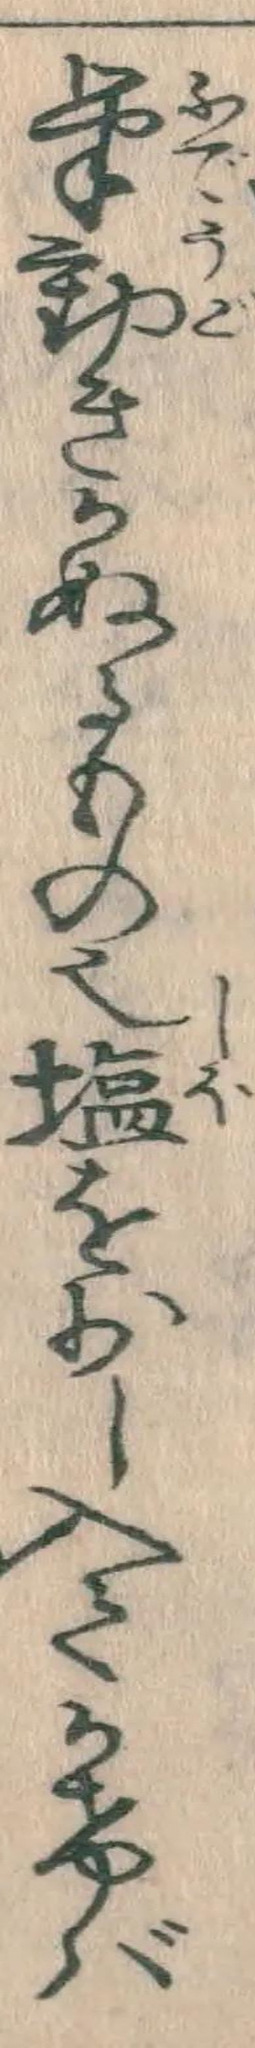筆動きかぬるもの也塩を少し入てかけば
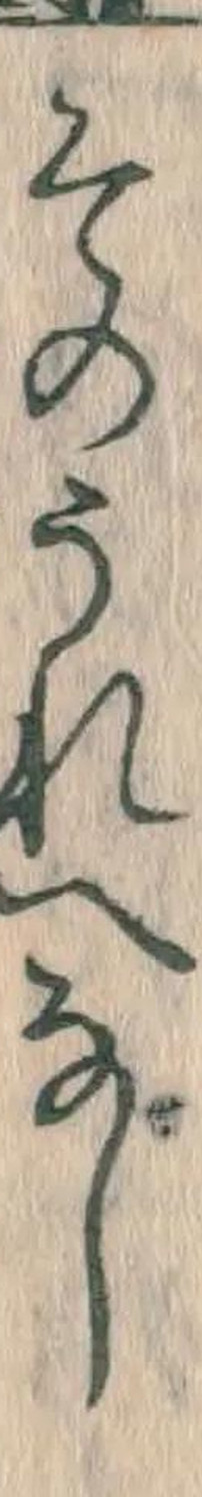そのうれへなし
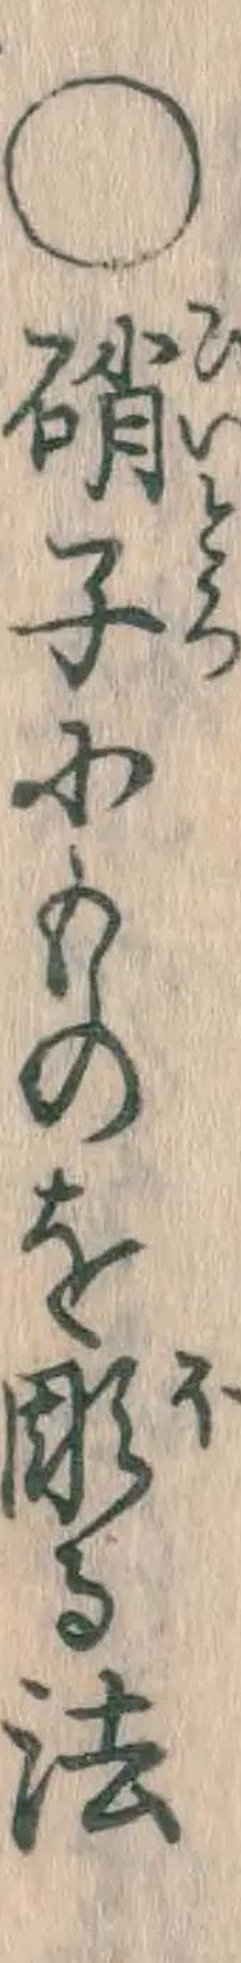○硝子にものを彫る法
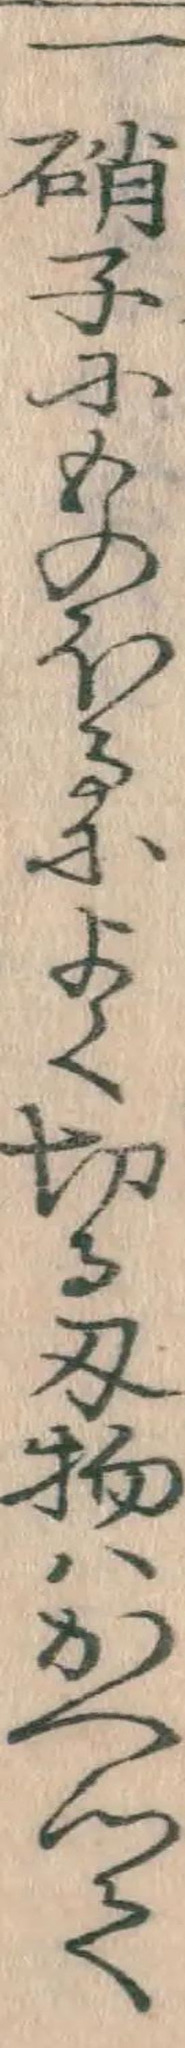一硝子にものほるによく切る刃物はかへつて
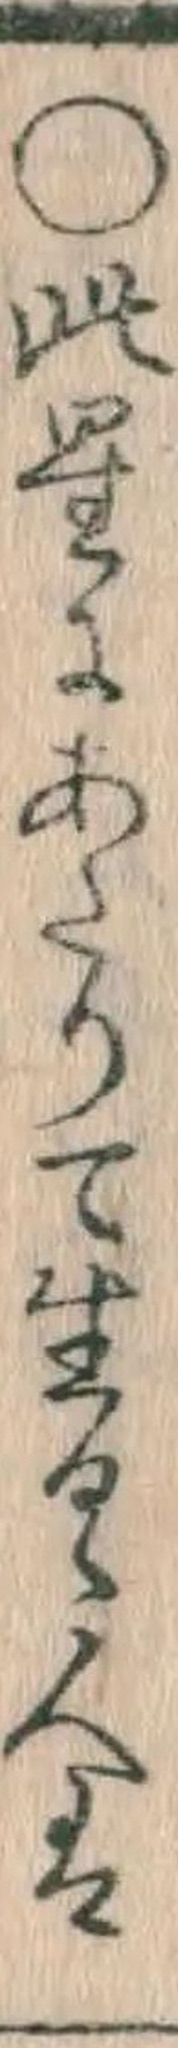○此星にあたりて生るゝ人は
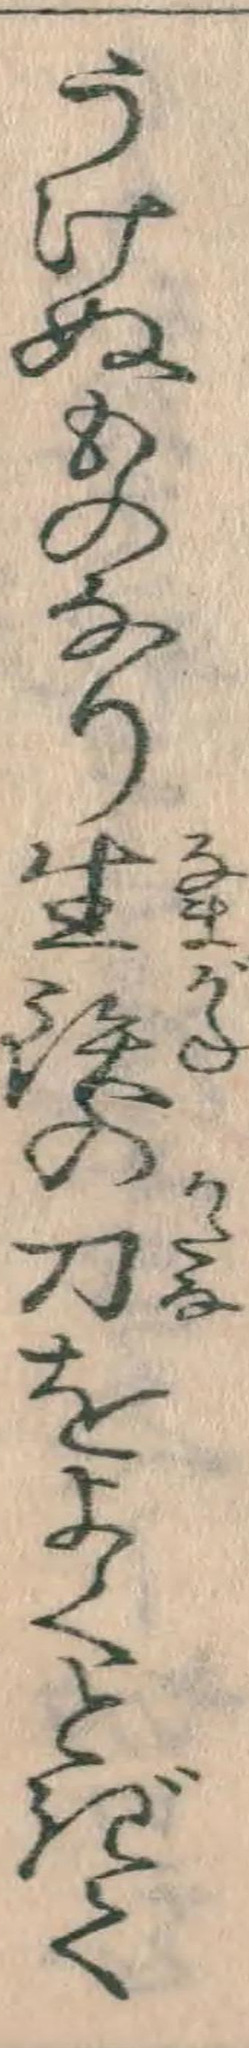うけぬものなり生鉄の刀をよくとぎて
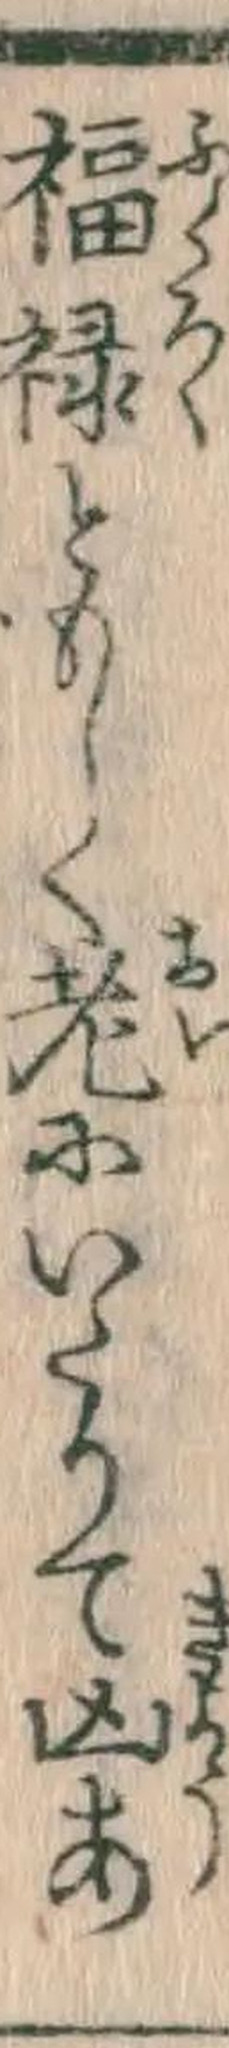福禄ともしく老にいたりて凶あ
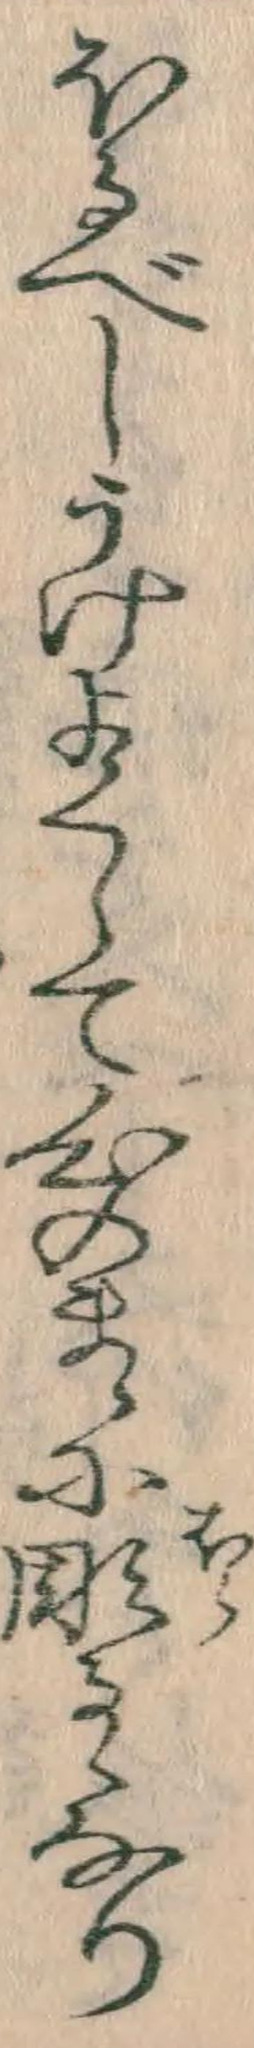ほるべしうけよくして心のまゝに彫るゝなり
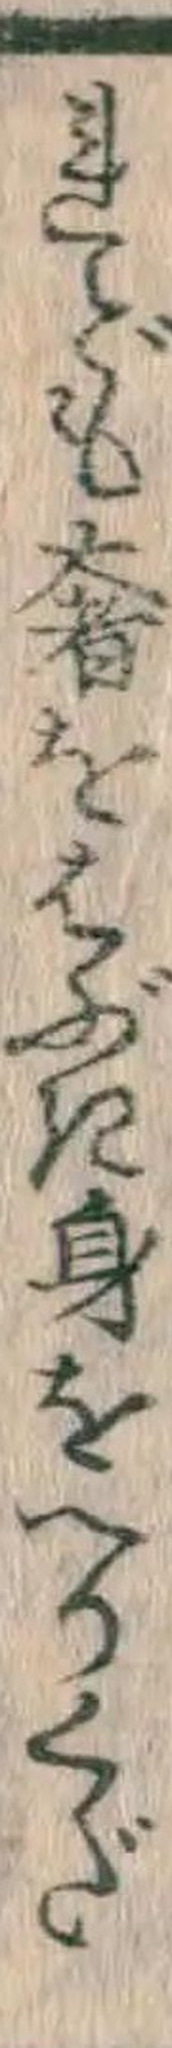れども奢をはぶき身をへりくだ
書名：広益秘事大全 3巻. [2]
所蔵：国立国会図書館 National Diet Library, JAPAN
